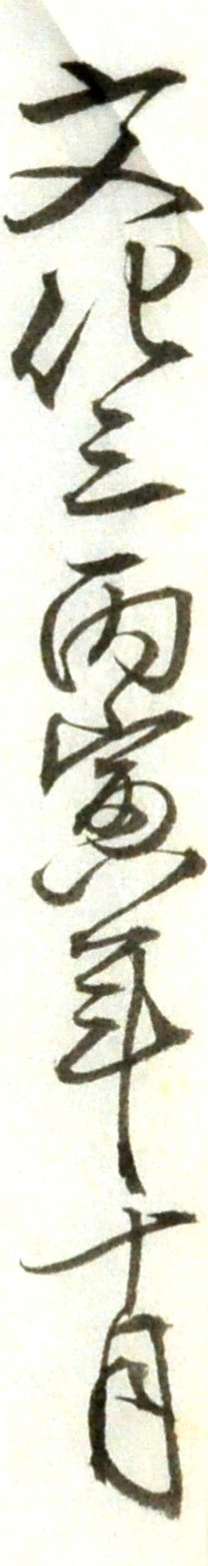文化三丙寅年十月
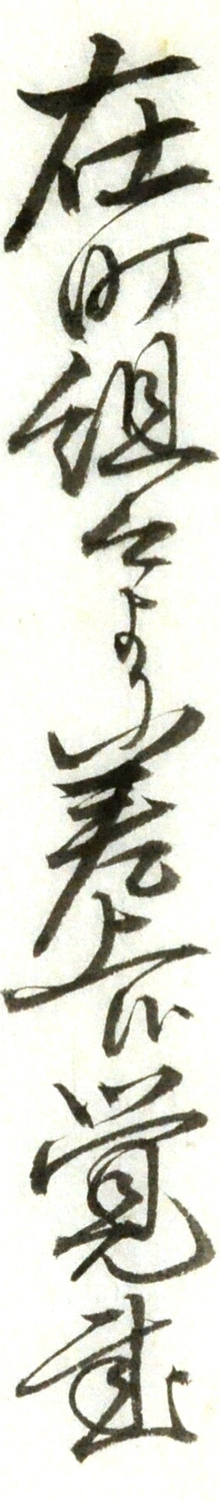在町組々より差上候覚書

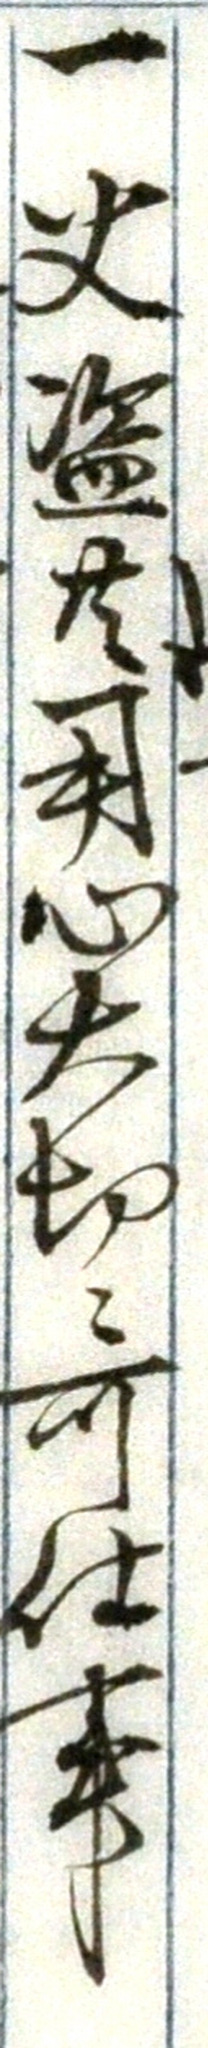一火盗共用心大切ニ可仕事
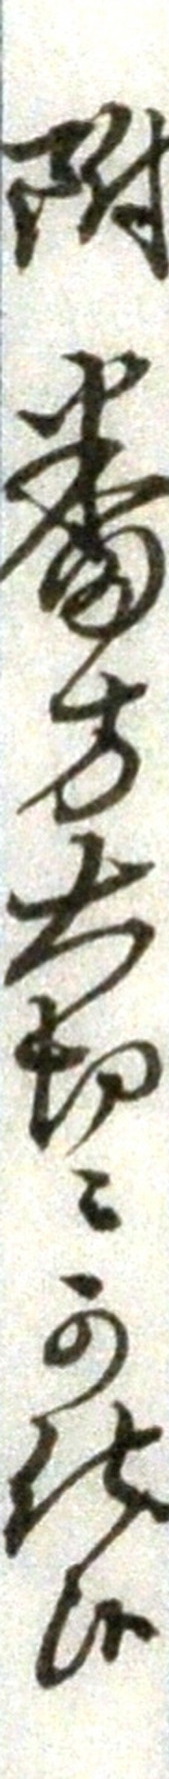附番方大切ニ可仕候
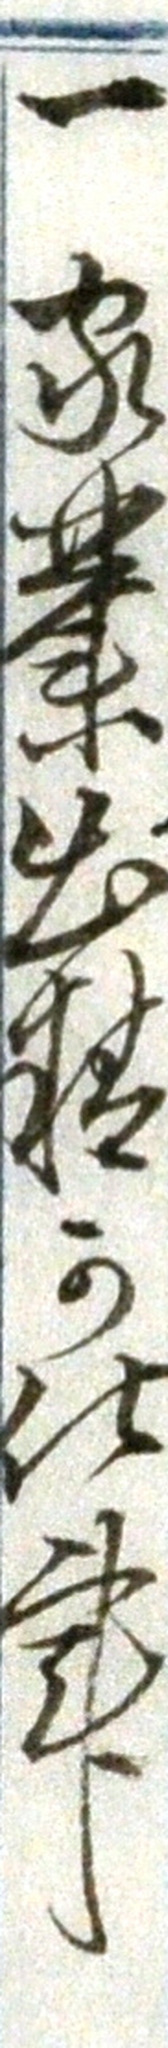一家業出精可仕事
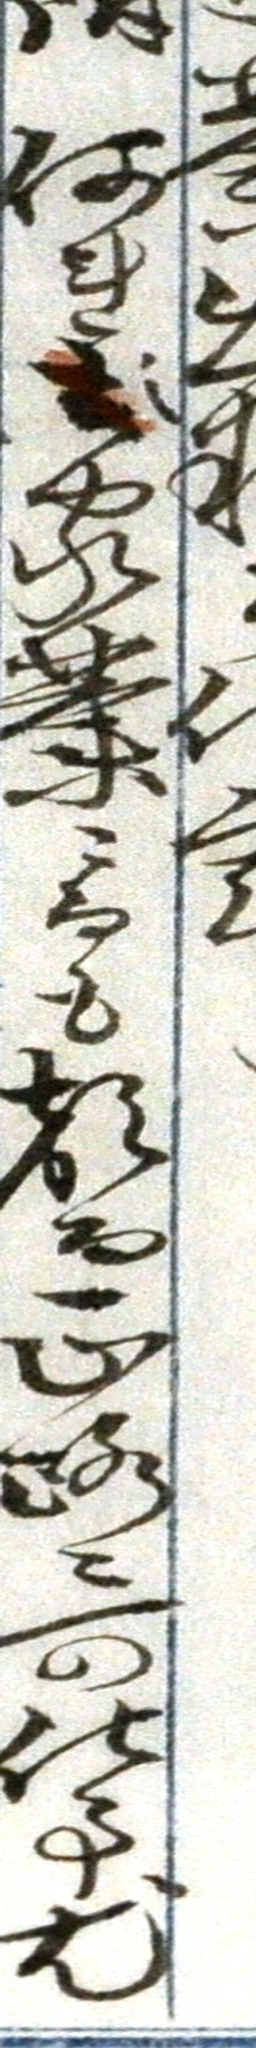附何れ之家業ニ而も都而正路ニ可仕事尤
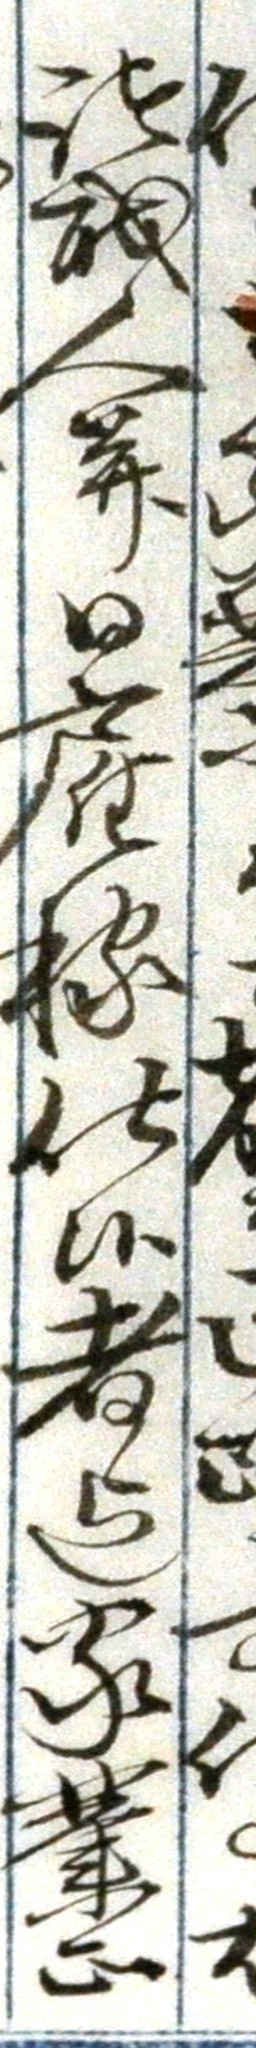諸職人幷日雇稼仕候者迄家業正
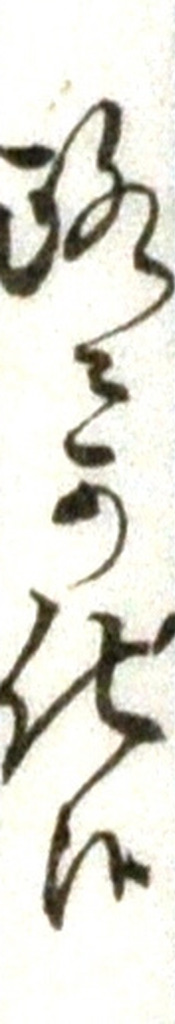路ニ可仕候
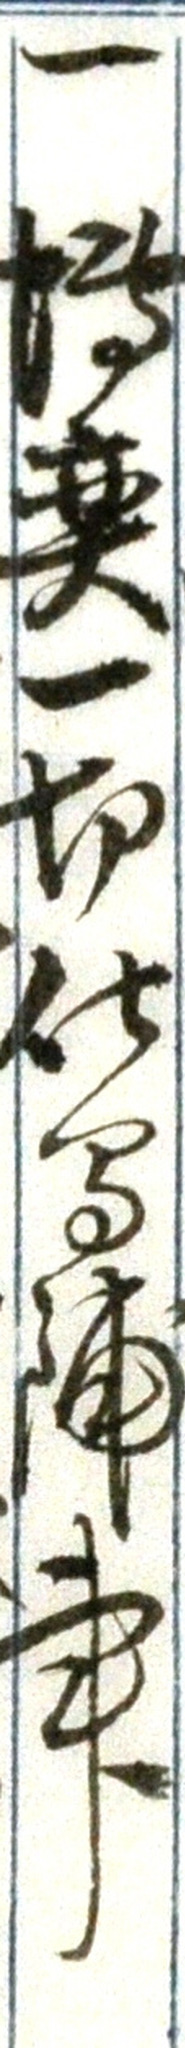一博奕一切仕間鋪事
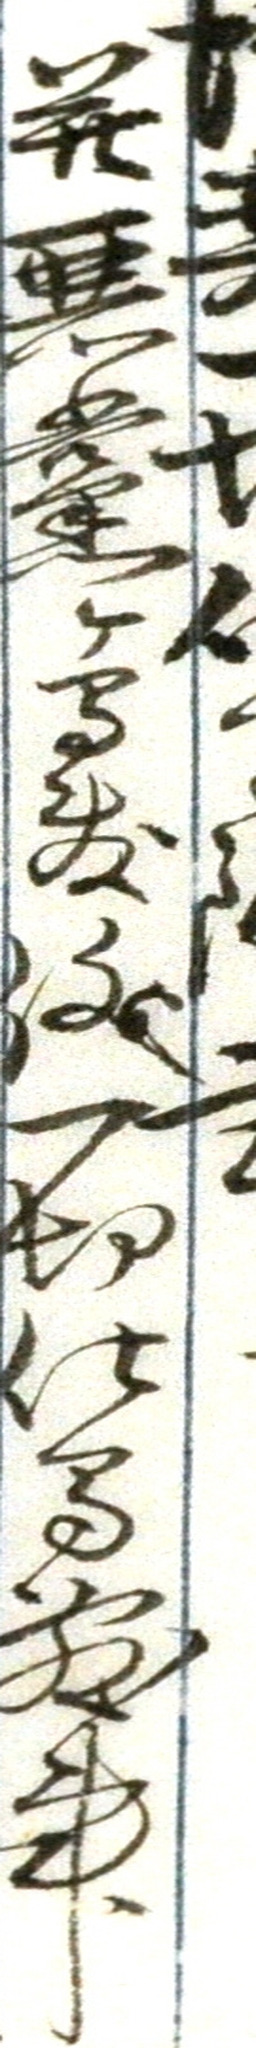幷悪党ケ間敷儀一切仕間敷事
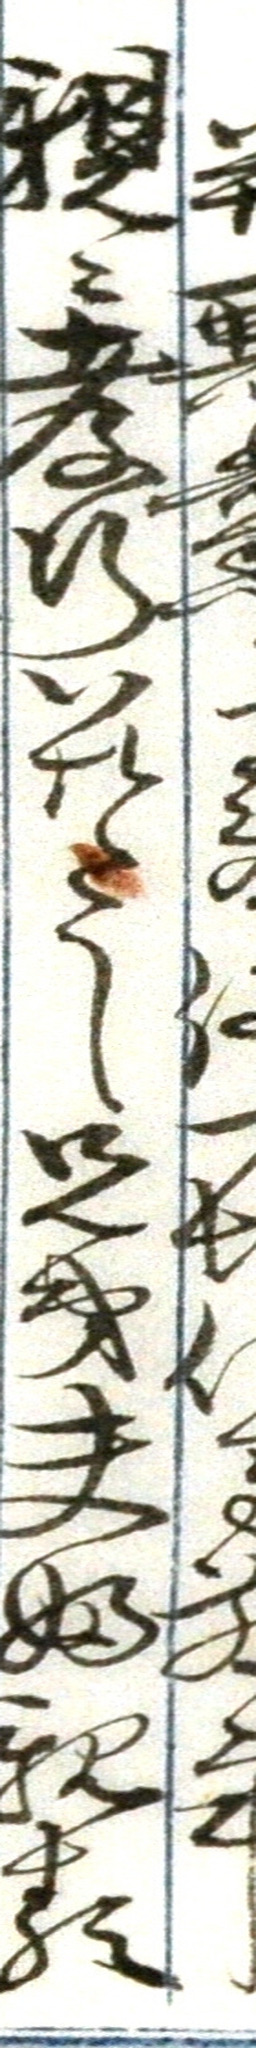一親ニ孝行いたし兄弟夫婦親類
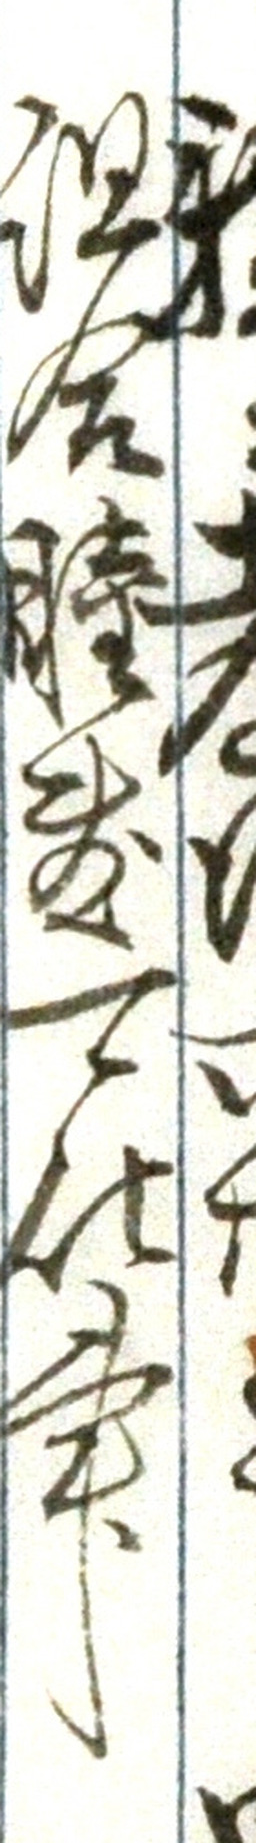組合睦敷可仕事
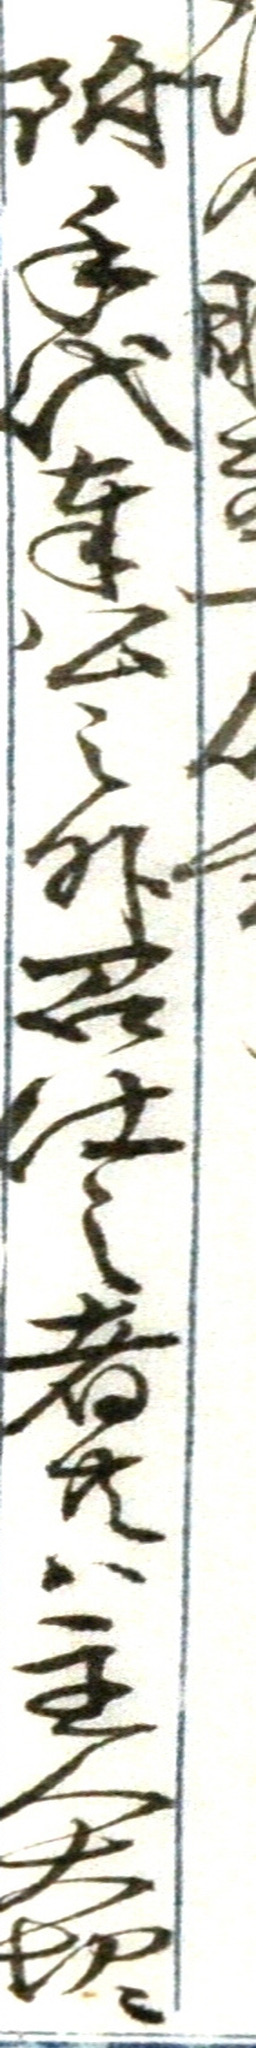附手代奉公之外召仕之者共ハ主人大切ニ

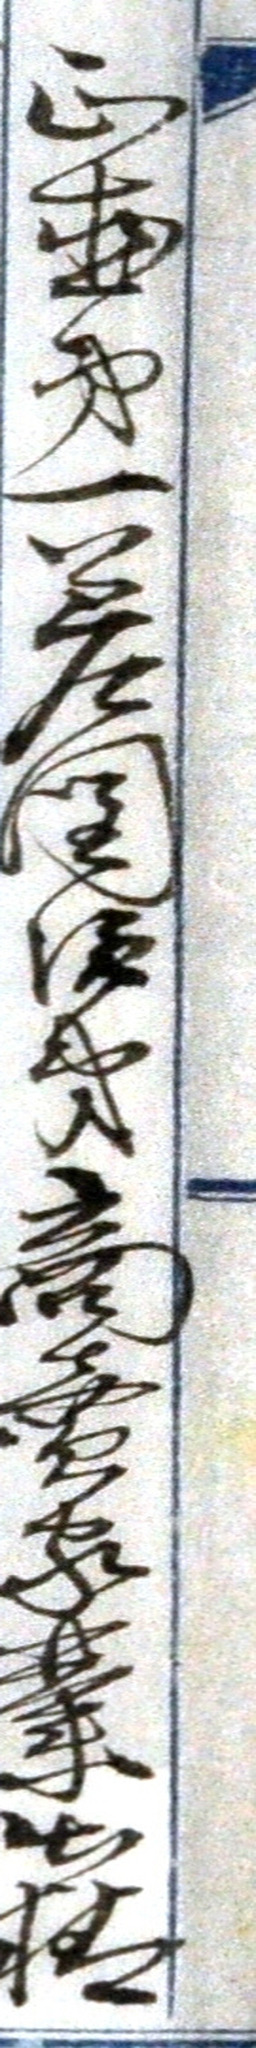正直第一差図次第商売家業出精
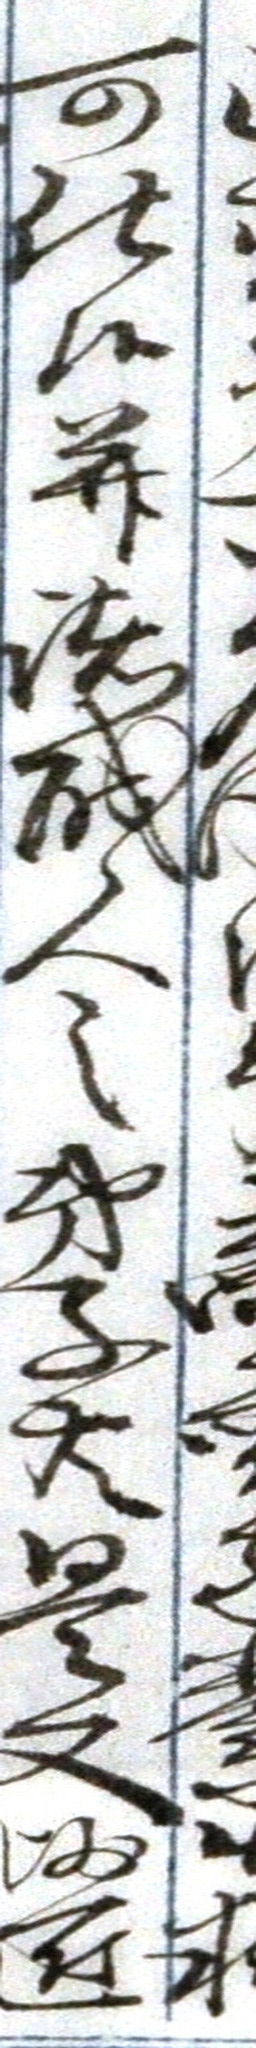可仕候幷諸職人之弟子共是又師匠
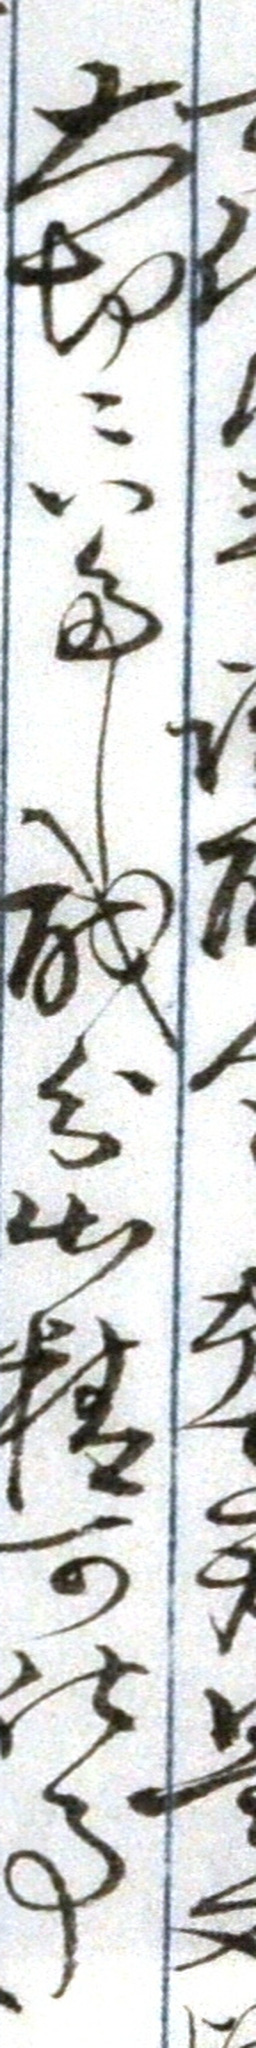大切ニいたし職分出精可仕事
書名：在町組合ヨリ差上候覚書
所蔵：伊那市立高遠町図書館・合同会社AMANE
